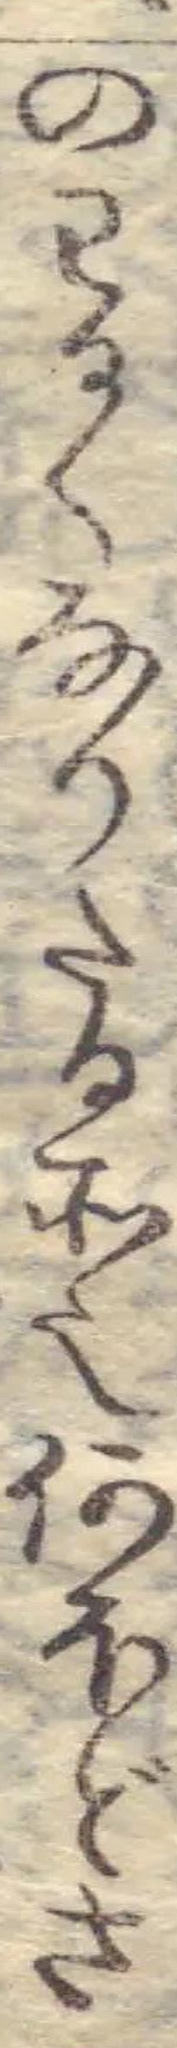のわるくなりたる所なり何ほどさ
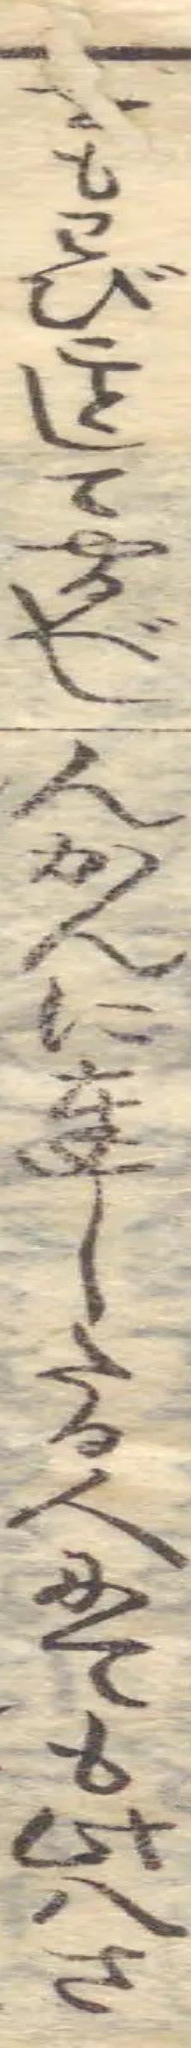をもわびことしてやるべし
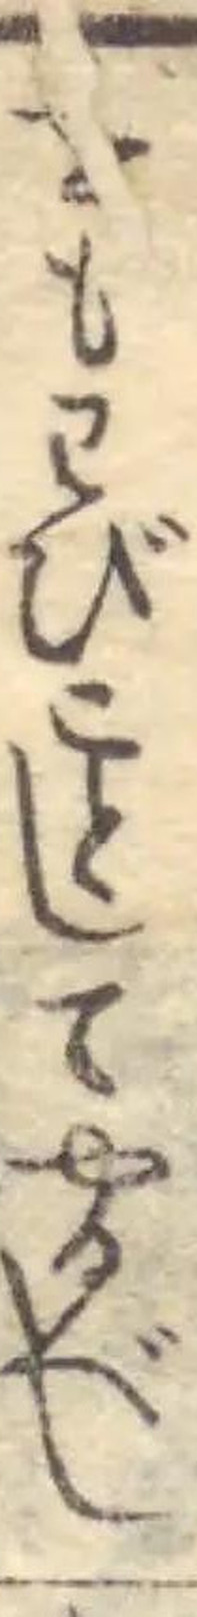をもわびことしてやるべし
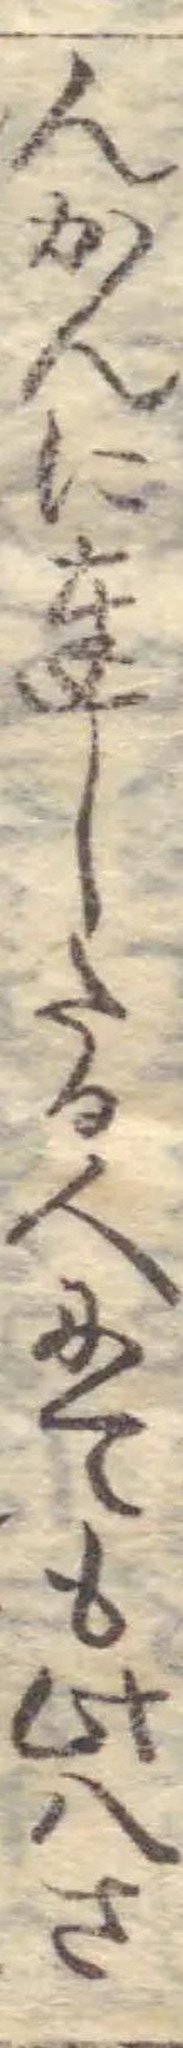んかんに達したる人にても此八さ
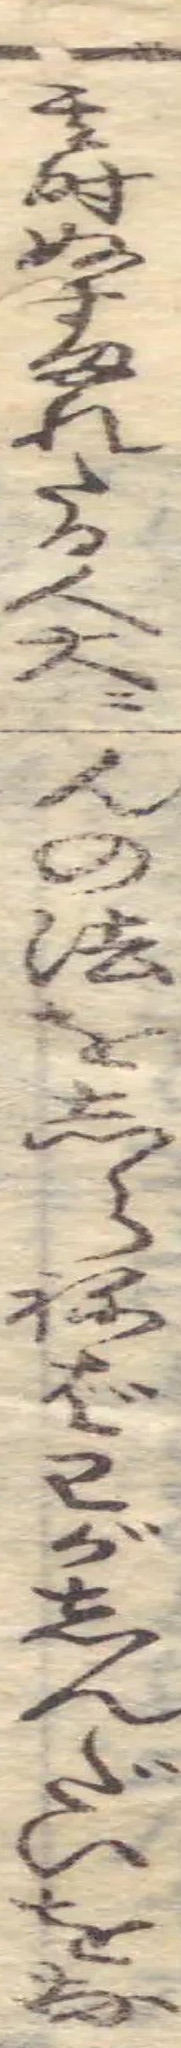其時ぬすまれたる人大に
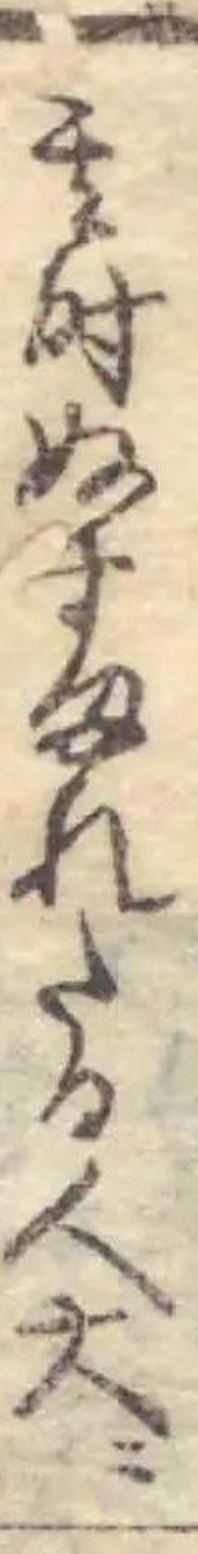其時ぬすまれたる人大に
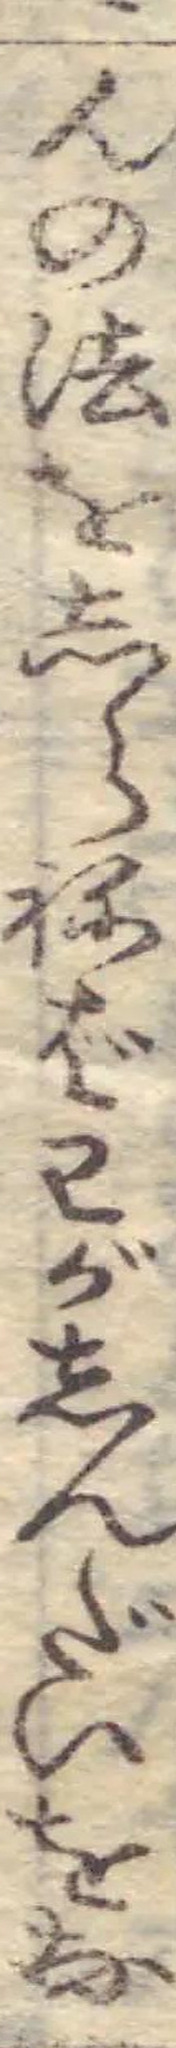んの法をしらねばわがしんだいをな
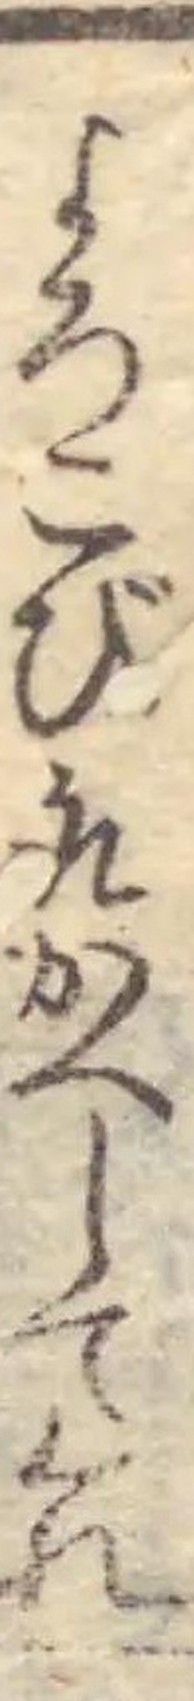よろこに取かへしてくれ
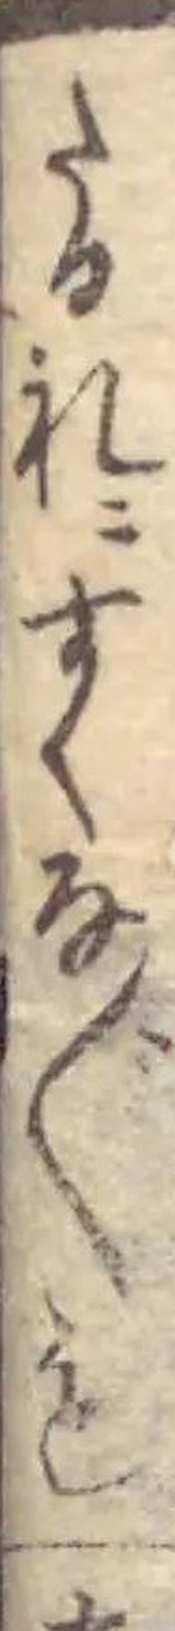たる礼にすくな〴〵も
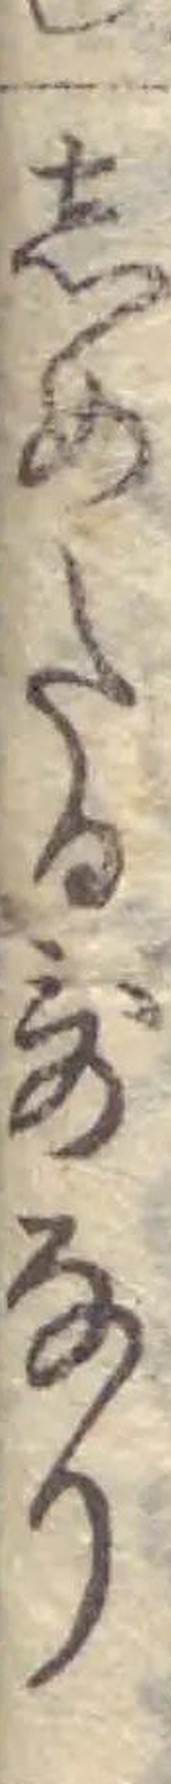しめたる哥なり
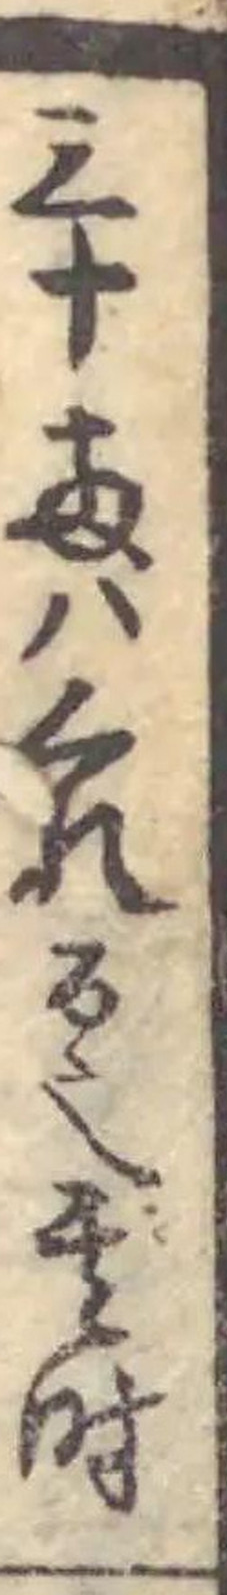三十両はくれる也其時
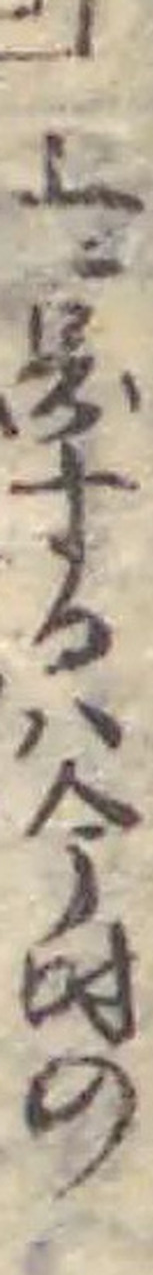上に図するは今時の
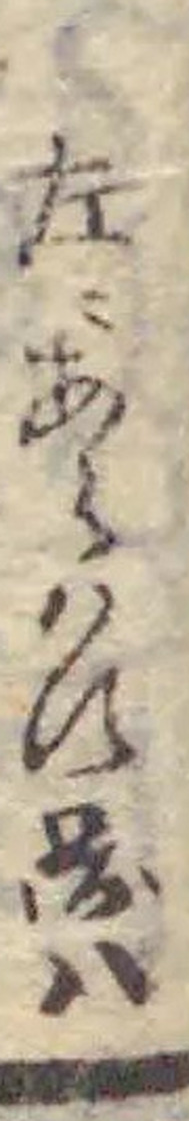左にあらはす図は
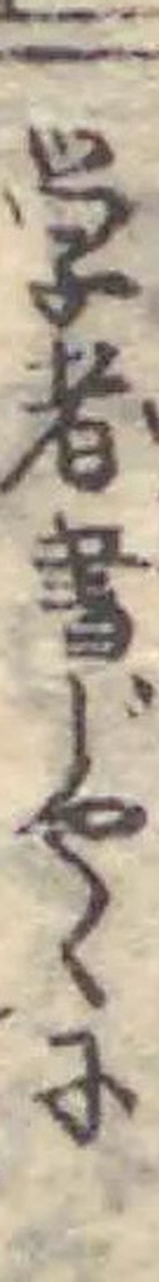学者書じやく？に
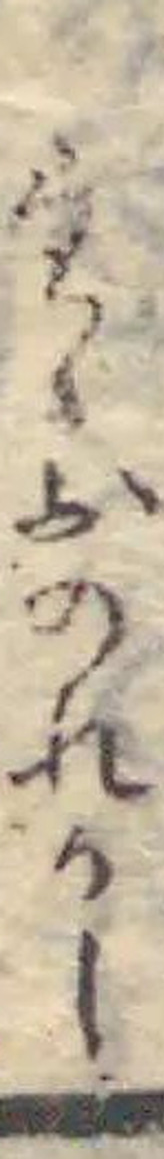たゞおのれかし
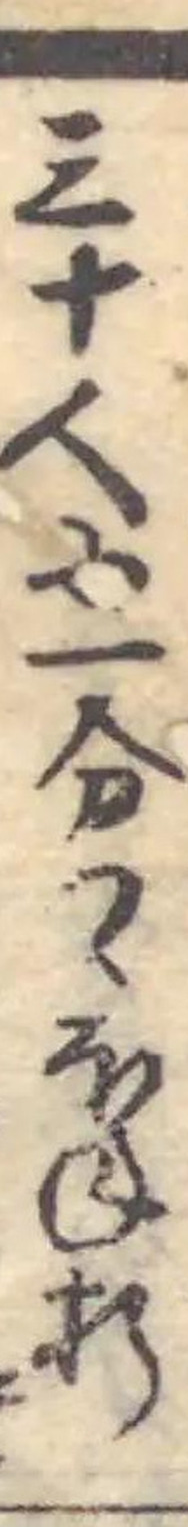三十人に一分つゝほね折
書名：大通人好記
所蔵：国立国会図書館 National Diet Library, JAPAN
